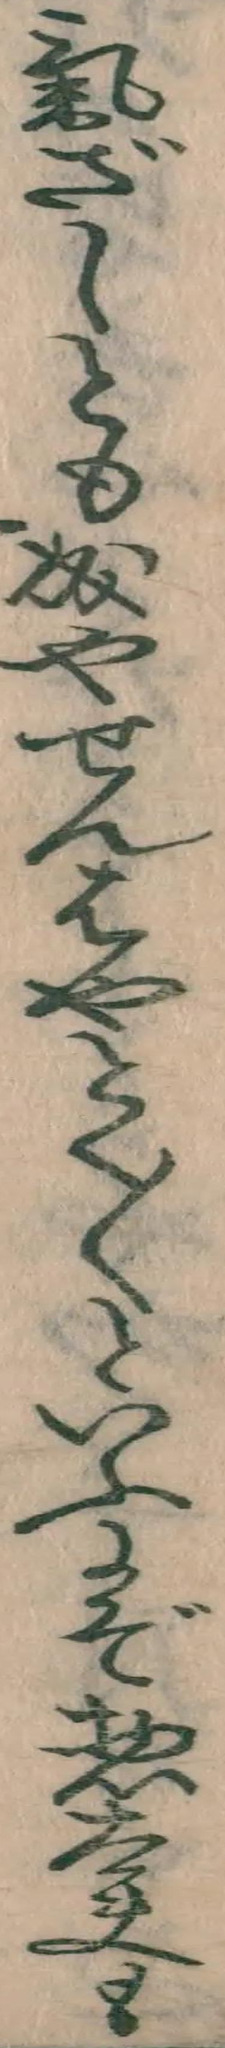気ざしとも成やせんはやとく〳〵といふにぞ惣太夫も
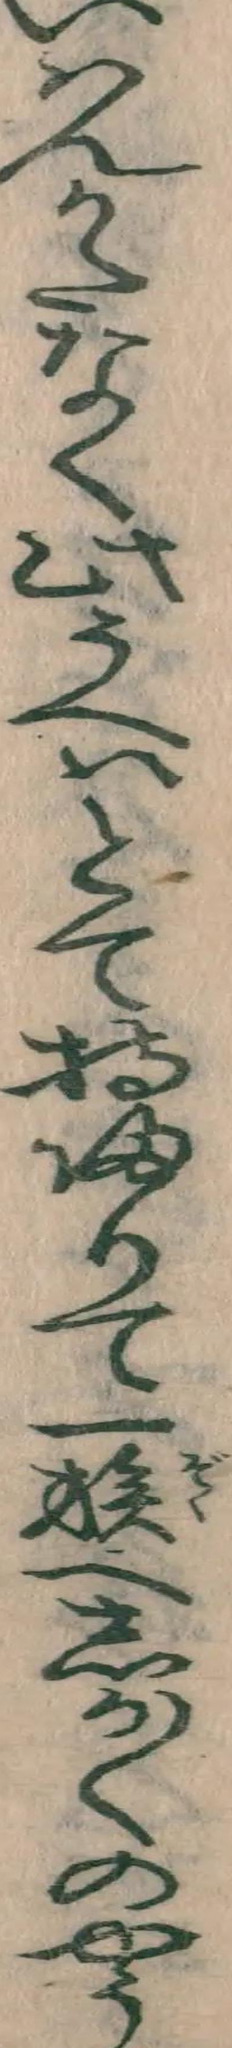いはんかたなく此うへはとて持帰りて一族へしか〳〵のやう
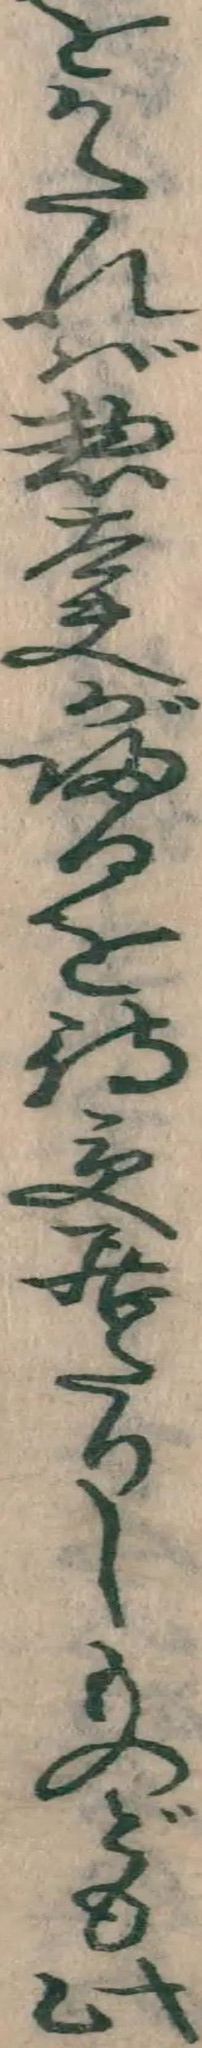をかたれば惣太夫が帰るを待受居たりしものども此
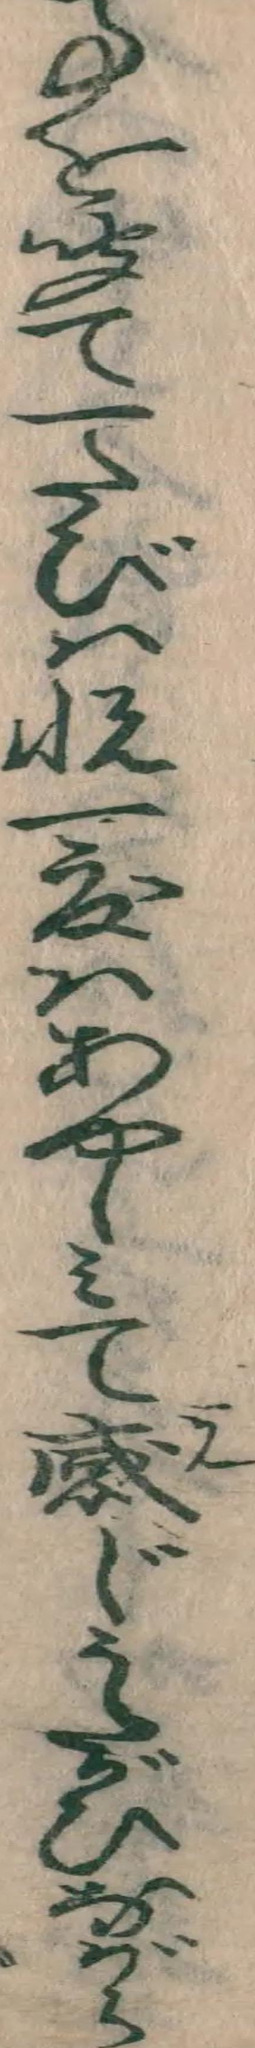事を聞て一たびは悦一度はあやしみて感じうたがひながら
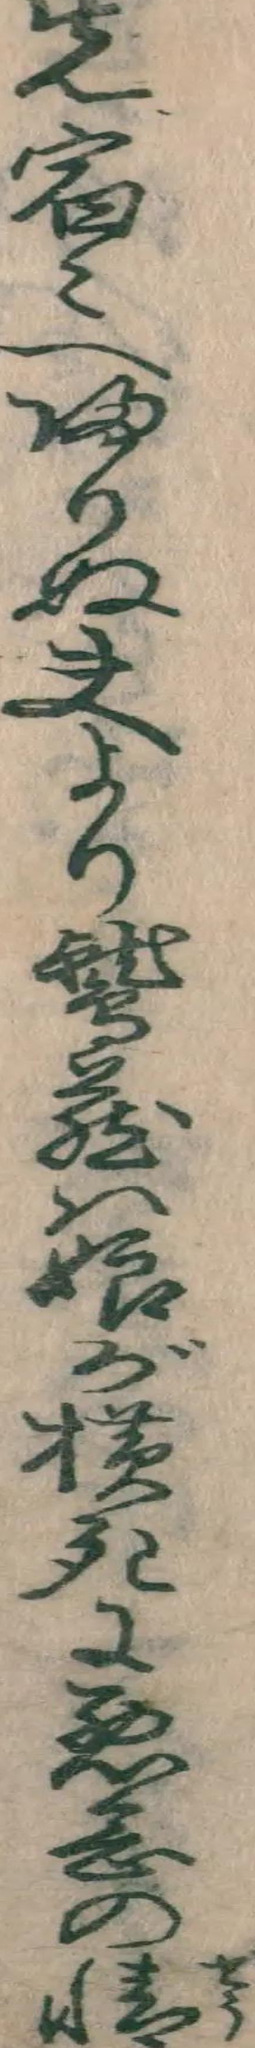先宿々へ帰りぬ夫より鷲蔵は娘が横死に悪念の情
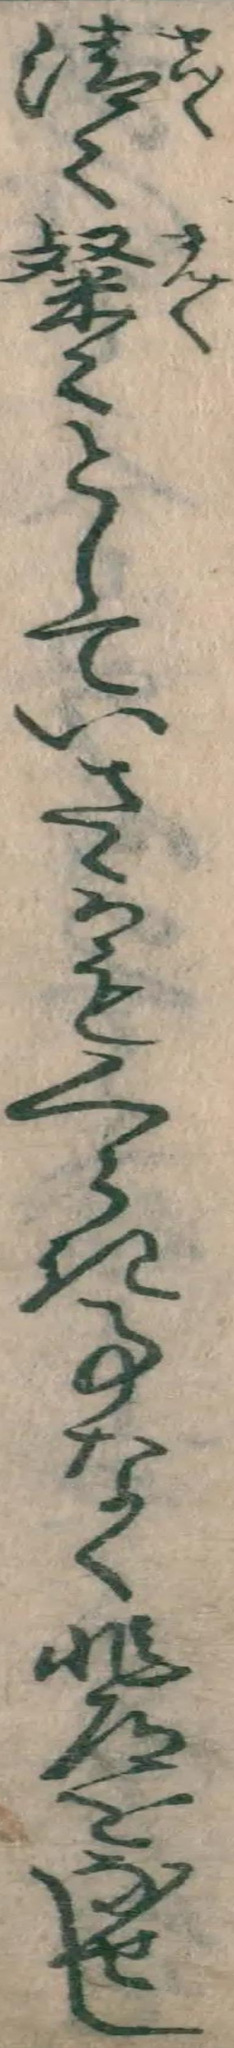清々粲々としていさゝかもくらき事なく非道をなせし
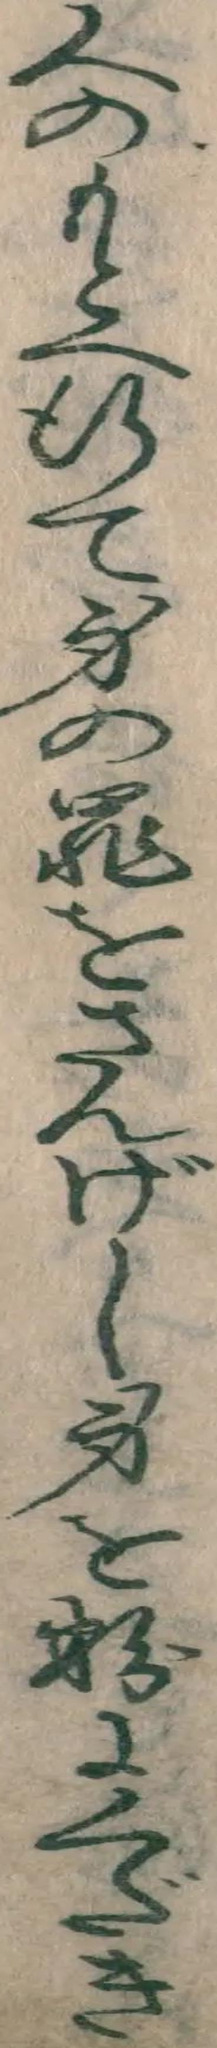人のもとへ行て身の罪をさんげし身を粉にくだき
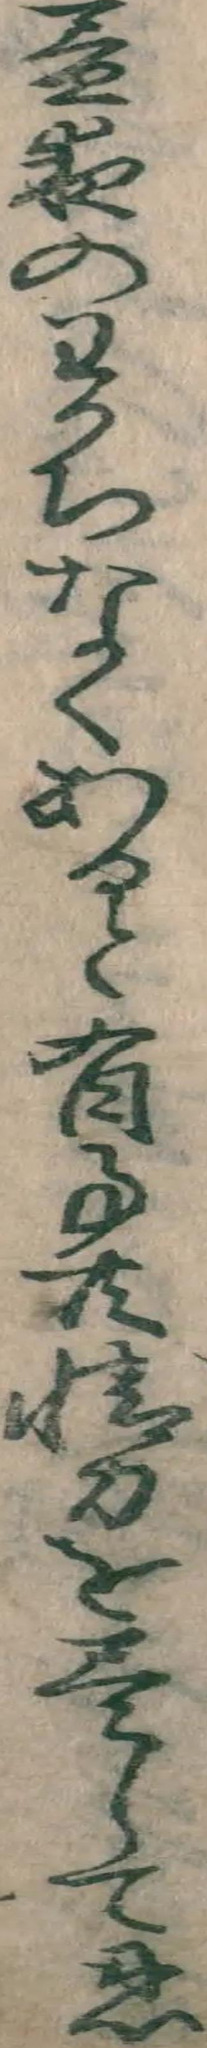昼夜のわかちなくあると有事共精力を尽して恩
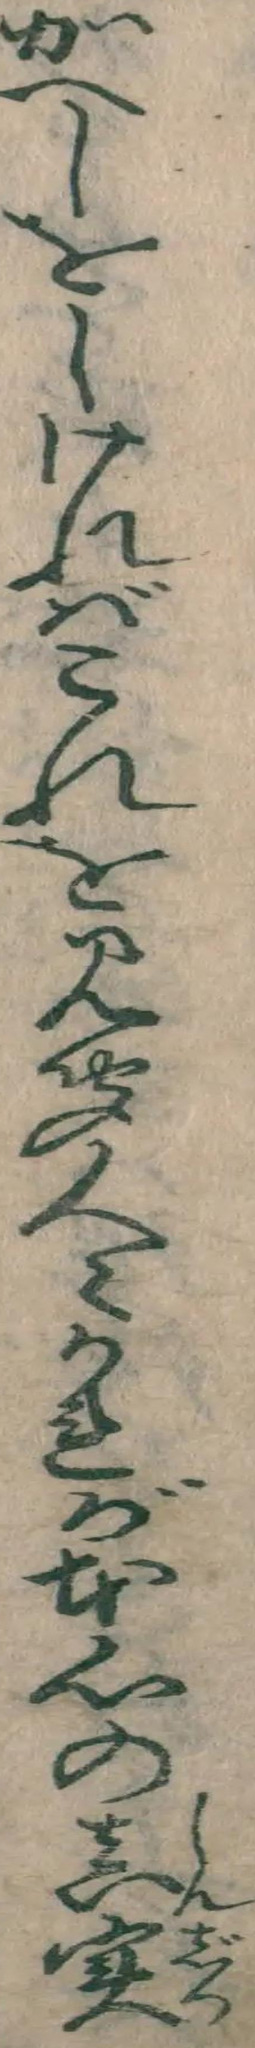かへしをしければこれを見聞人々かれが本心の真実

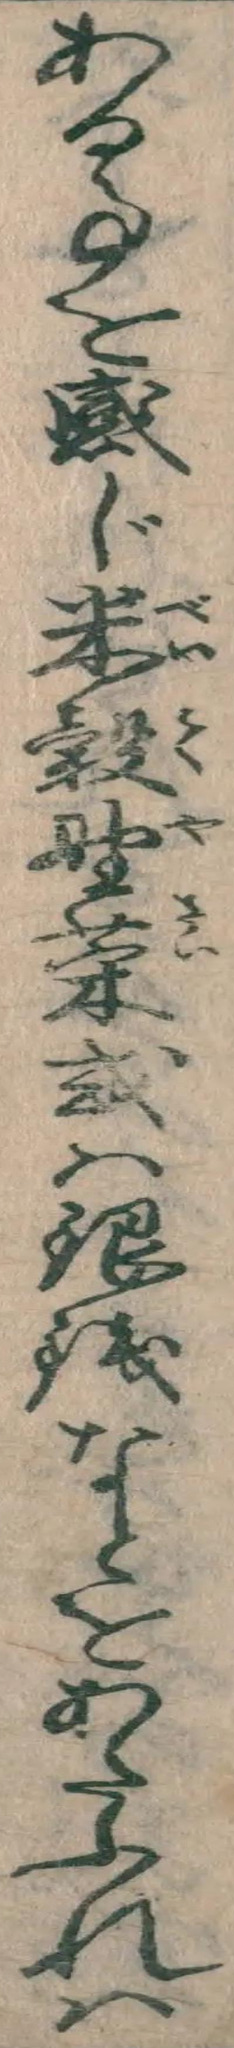ある事を感じ米穀野菜或は銀銭なとをあたふれは
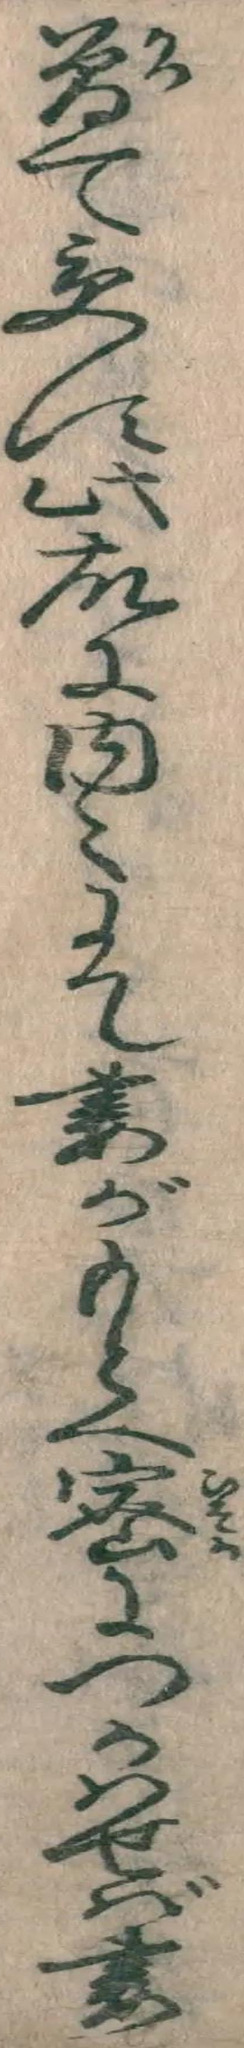曽て受す此故に内々にて妻がもとへ密につかはせば妻
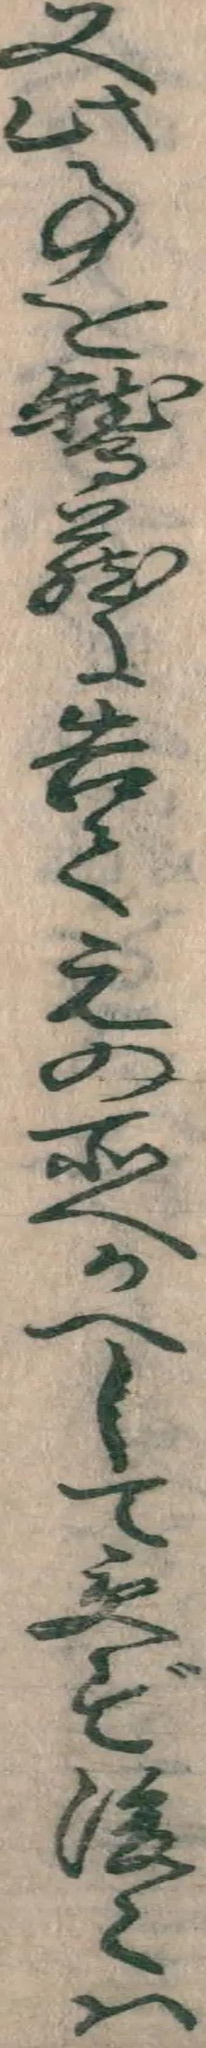又此事を鷲蔵に告て元の所へかへして受ず後々は
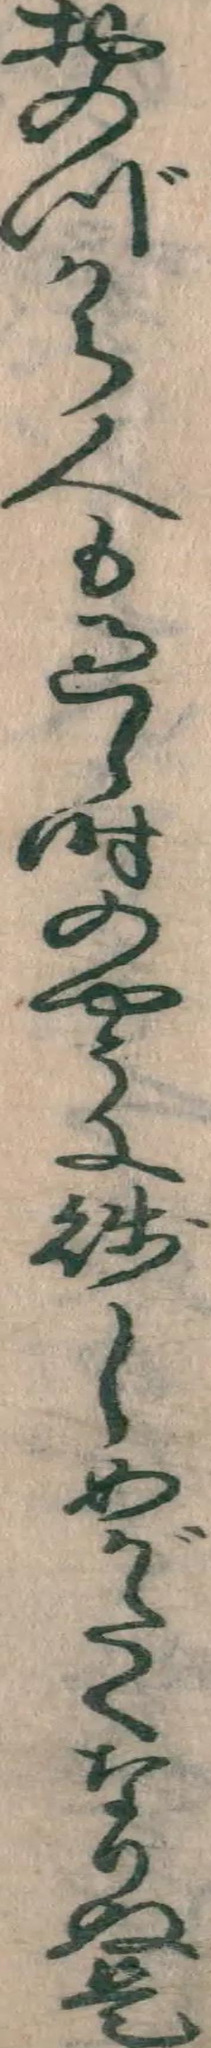おのづから人も過し時のやうに賎しめがたくなりぬ是
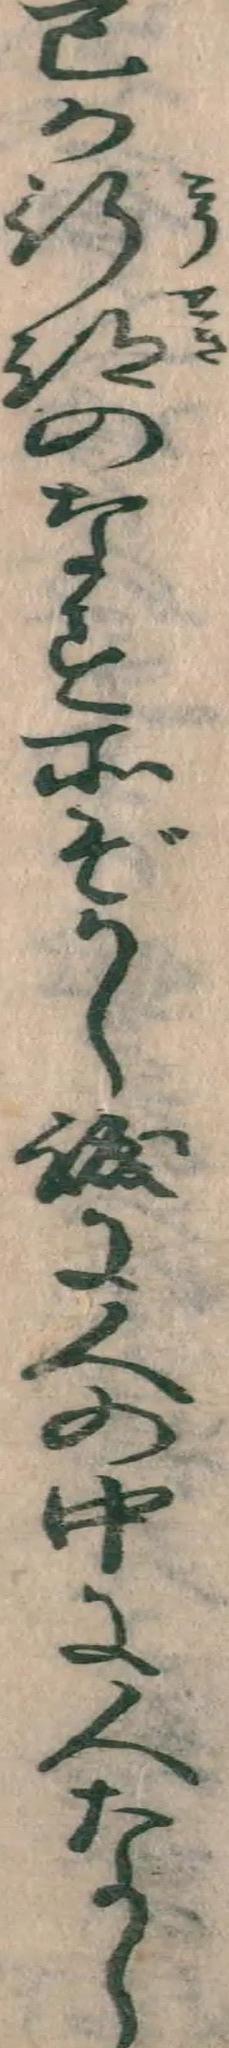己か行跡なす所ぞかし誠に人の中に人なし
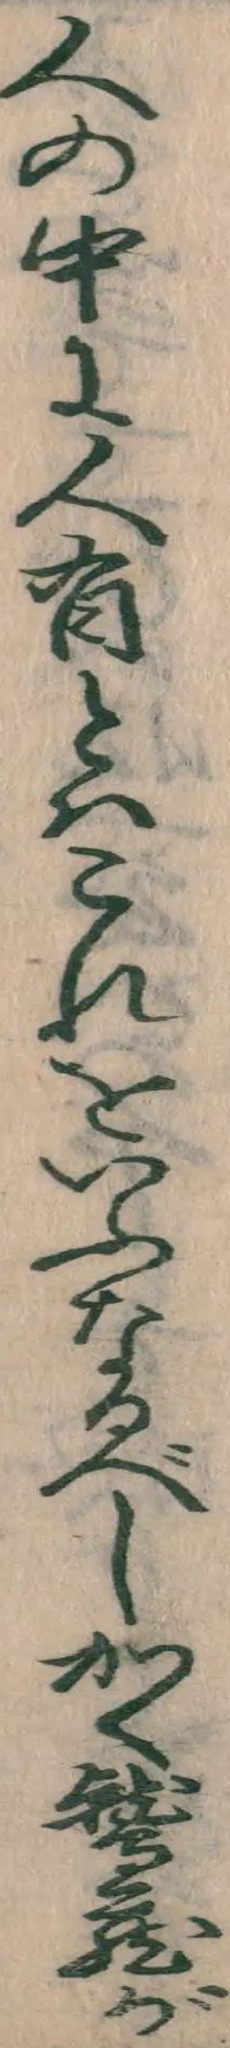人の中に人有とはこれをおふなるべしかく鷲蔵が
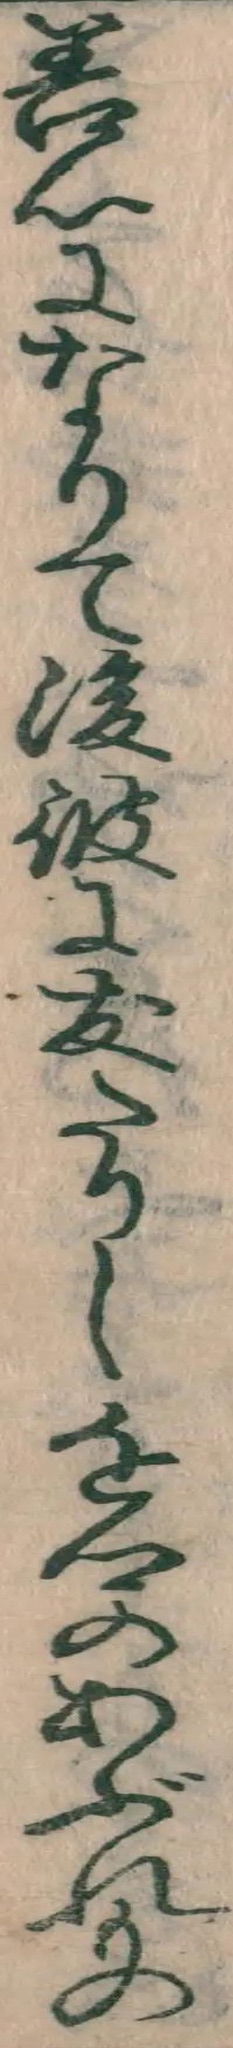善心になりて後彼に友たりし近郷のあぶれもの
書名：怪談御伽童 5巻. [1]
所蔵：国立国会図書館 National Diet Library, JAPAN
